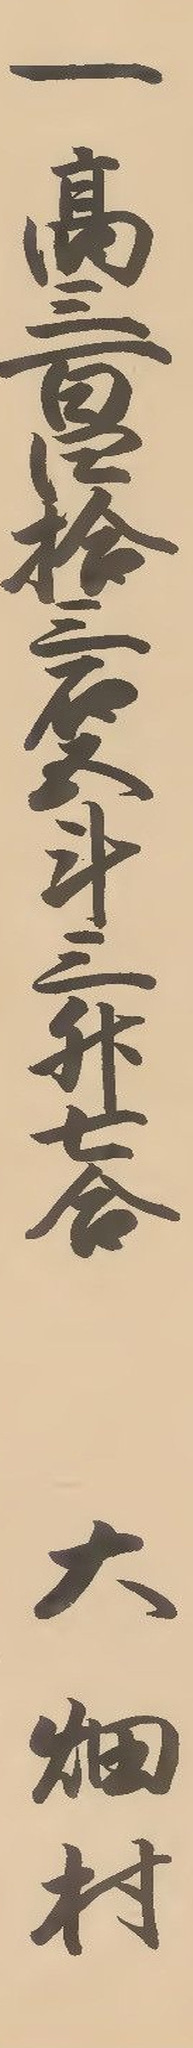一高三百四拾三石五斗三升七合大畑村

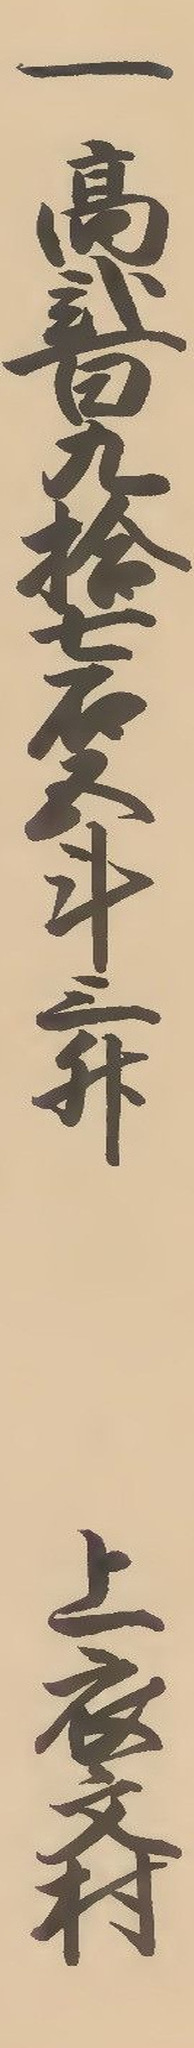一高弐百九拾七石五斗三升上衣文村
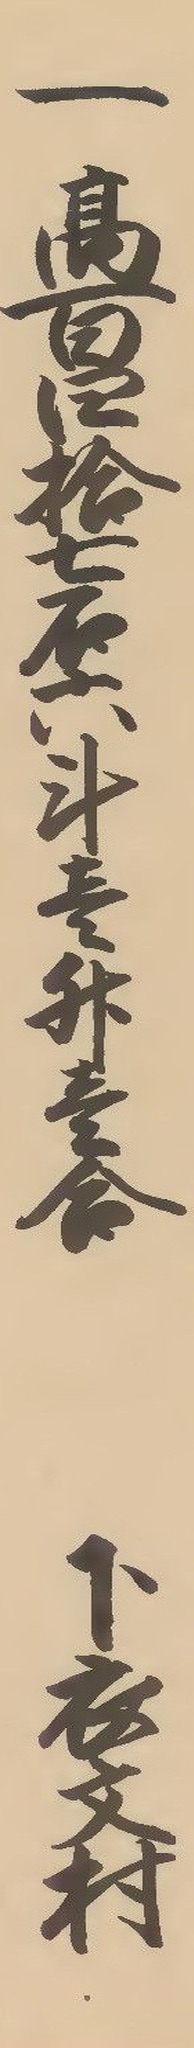一高百四拾七石六斗壱升壱合下衣文村
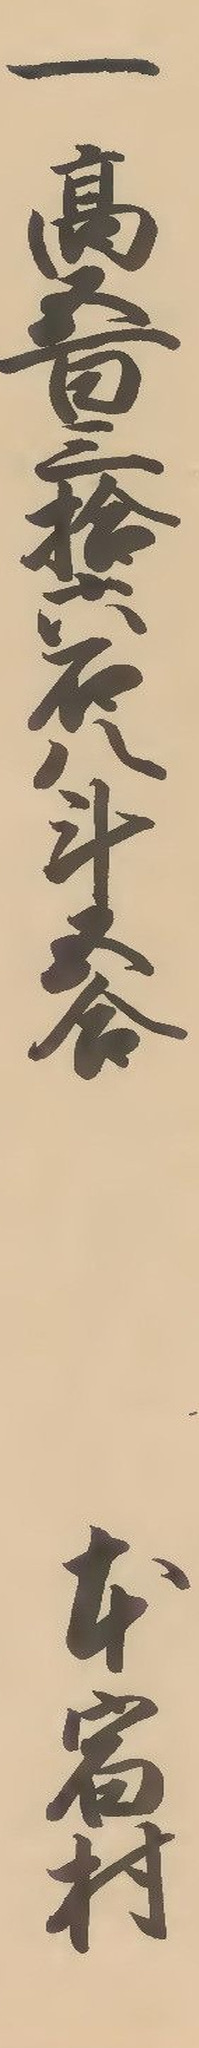一高五百三拾六石八斗五合本宿村
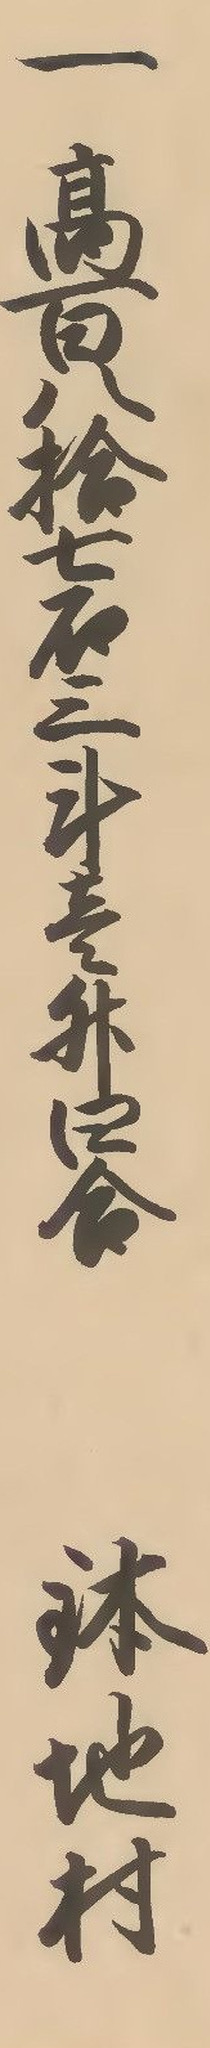一高百八拾七石三斗壱升四合鉢地村
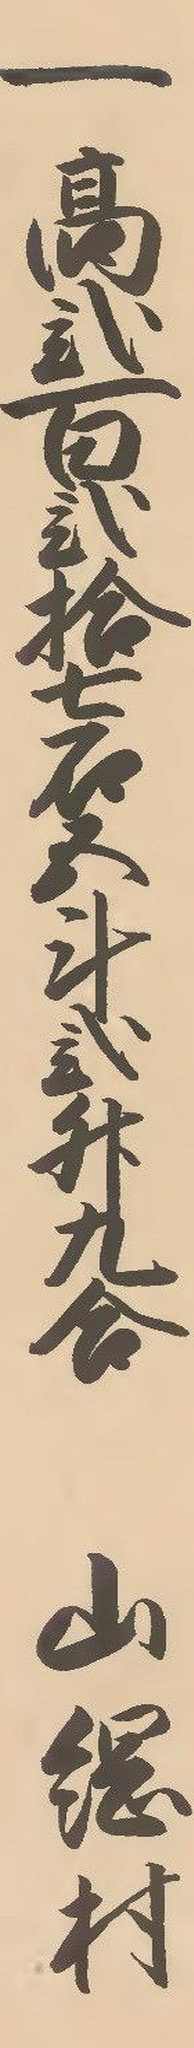一高弐百弐拾七石五斗弐升九合山綱村
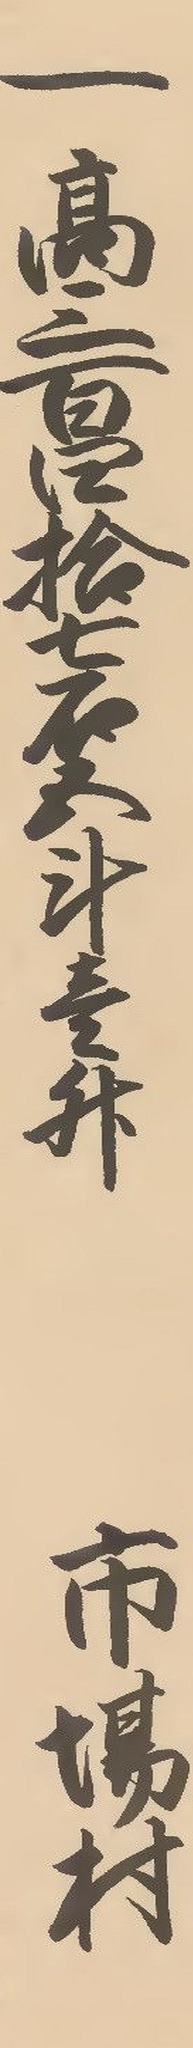一高三百四拾七石五斗壱升市場村
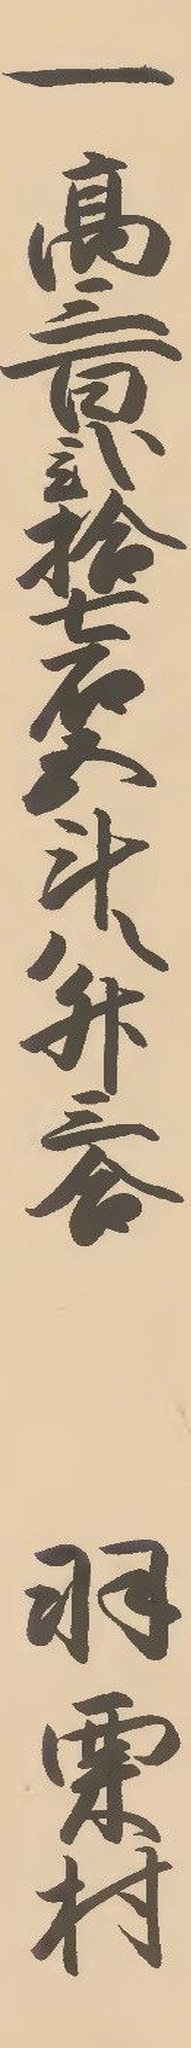一高三百弐拾七石五斗八升三合羽栗村
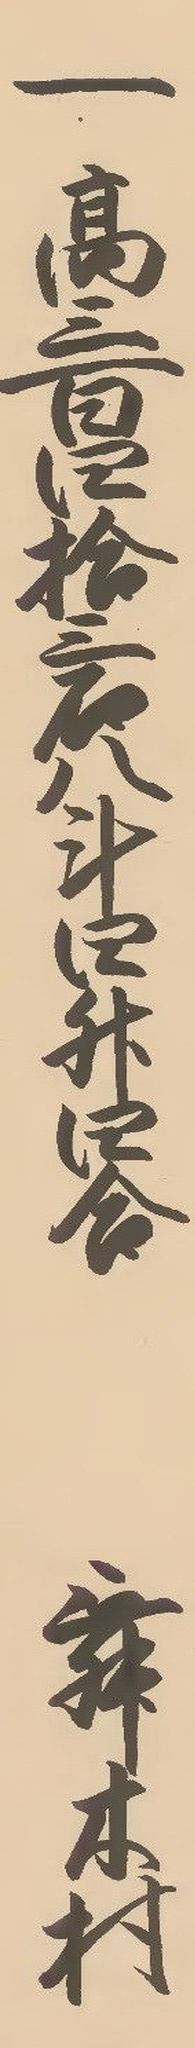一高三百四拾三石八斗四升四合舞木村

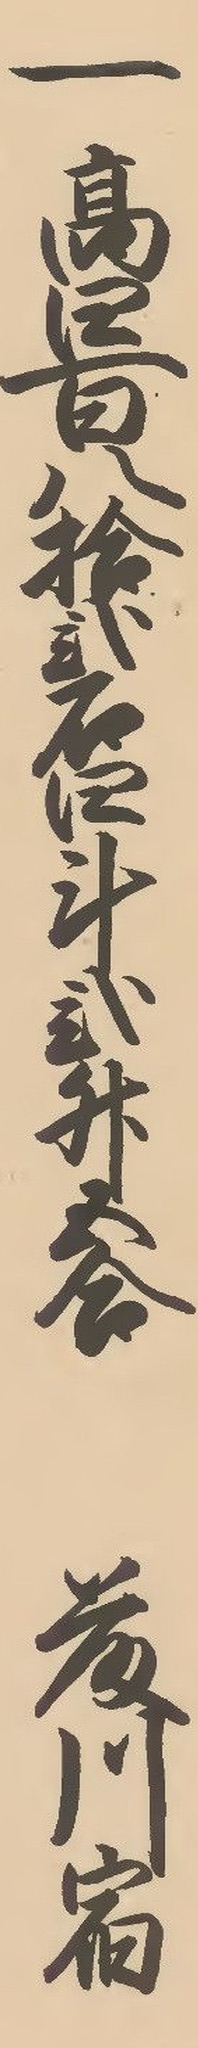一高四百八拾弐石四斗弐升五合藤川宿
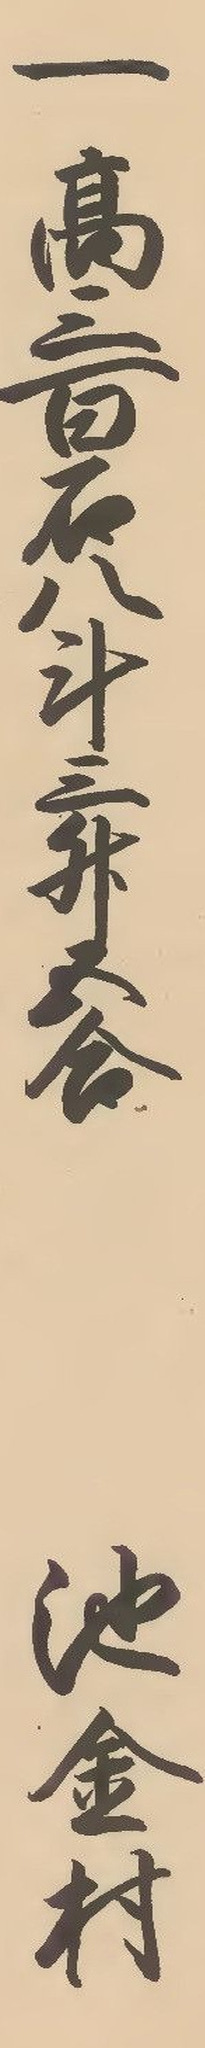一高三百石八斗三升五合池金村
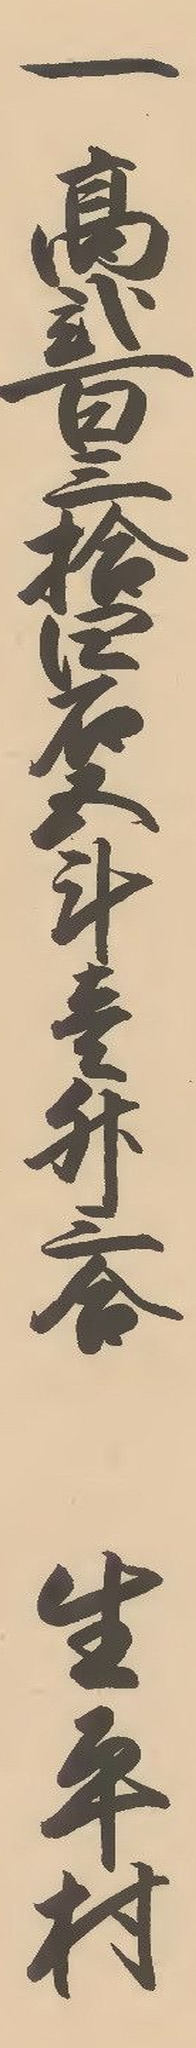一高弐百三拾四石五斗壱升三合生平村
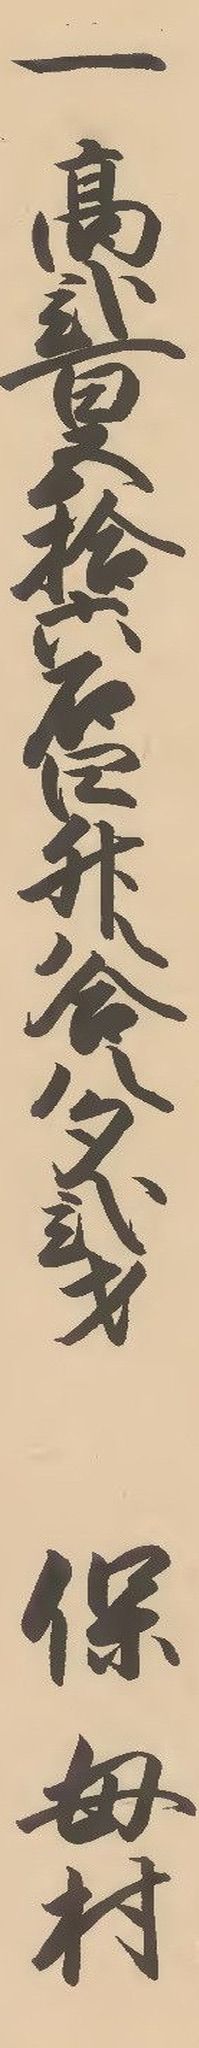一高弐百五拾六石四升八合八勺弐才保母村
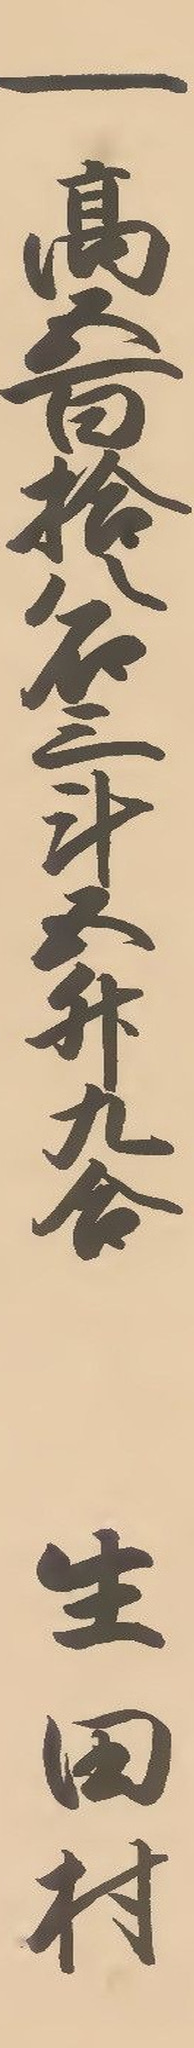一高五百拾八石三斗五升九合生田村
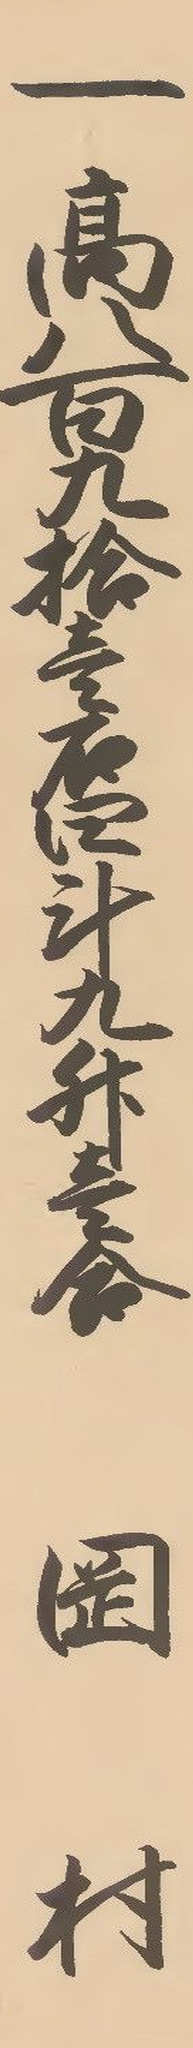一高八百九拾壱石四斗九升壱合岡村
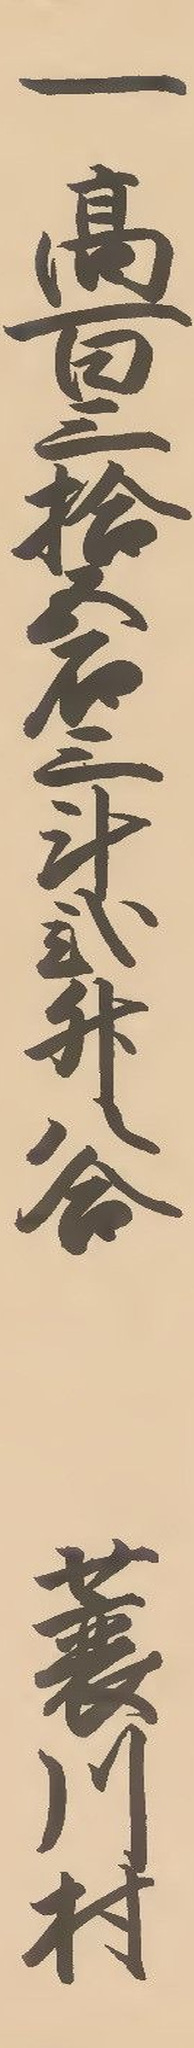一高百三拾五石三斗弐升八合簔川村
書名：三河国郷帳
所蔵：国立公文書館 National Archives of Japan
